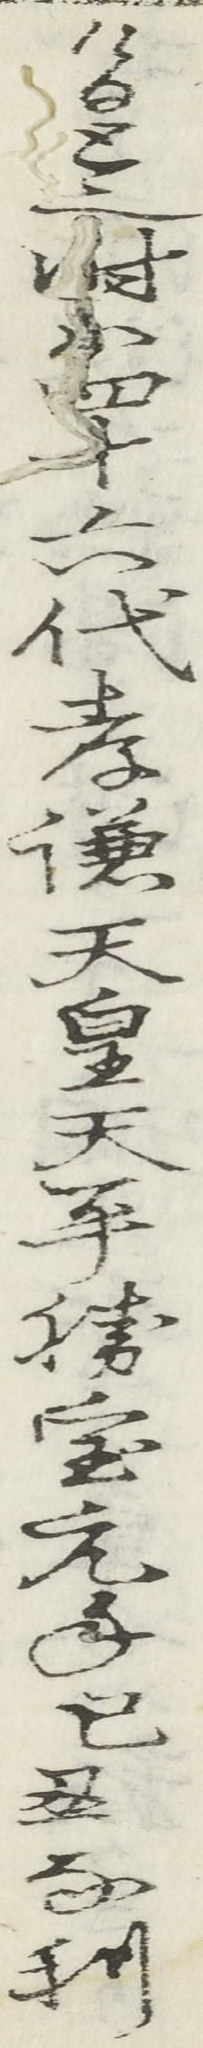けると也時は四十六代孝謙天皇天平勝宝元年己丑なり
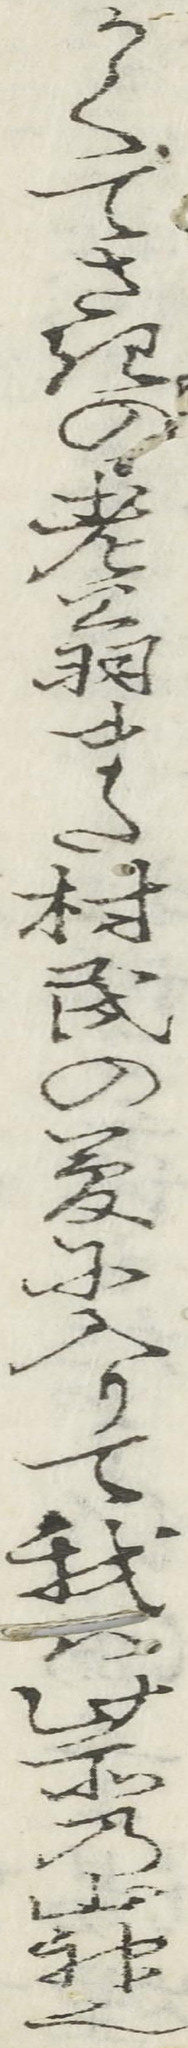かくてさきの老翁また村民の夢に入りて我は此所の山神也
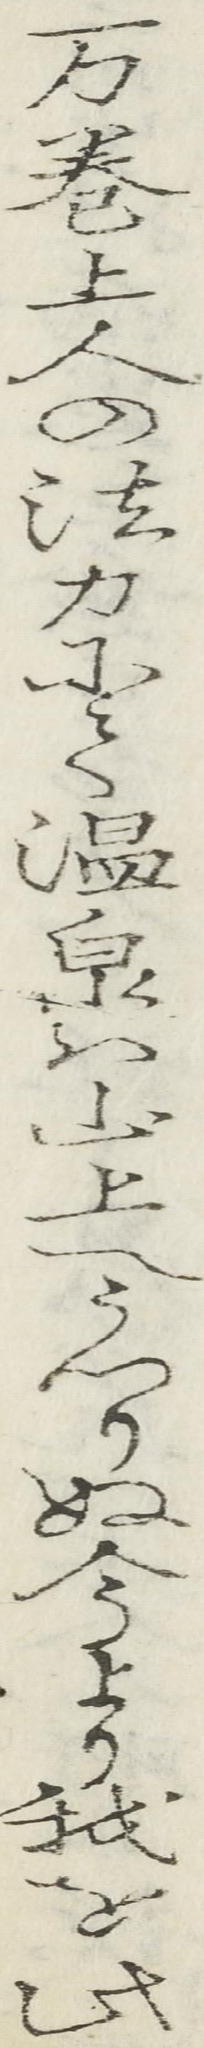万巻上人の法力にて温泉は山上へうつりぬ今より我を此
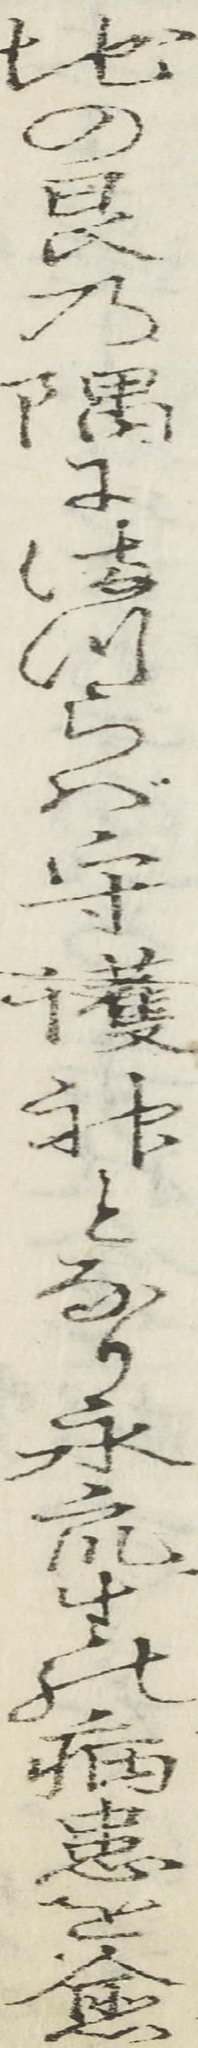地の艮の隅にまつらば守護神となり永衆生の病患を愈
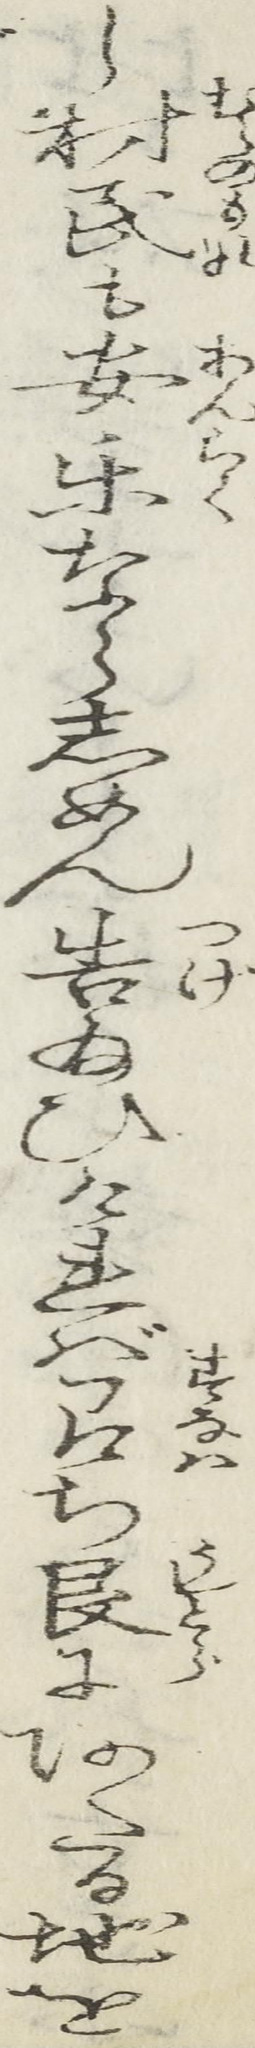し村民も安楽ならしめん告給ひければ即ち艮にあたる地を
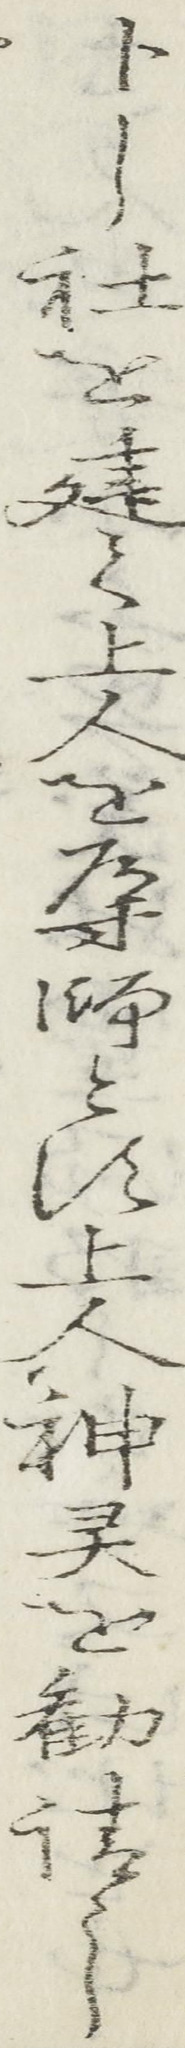卜し社を建て上人を導師とす上人神霊を勧請し
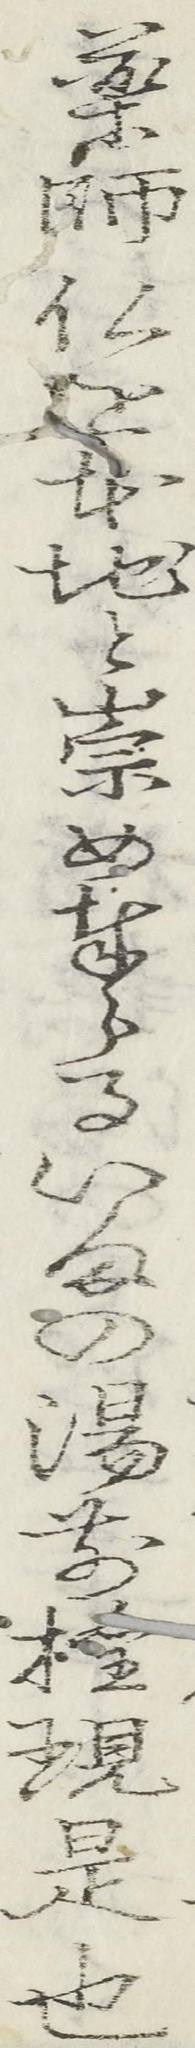薬師仏を本地と崇め奉らるいまの湯前権現是也
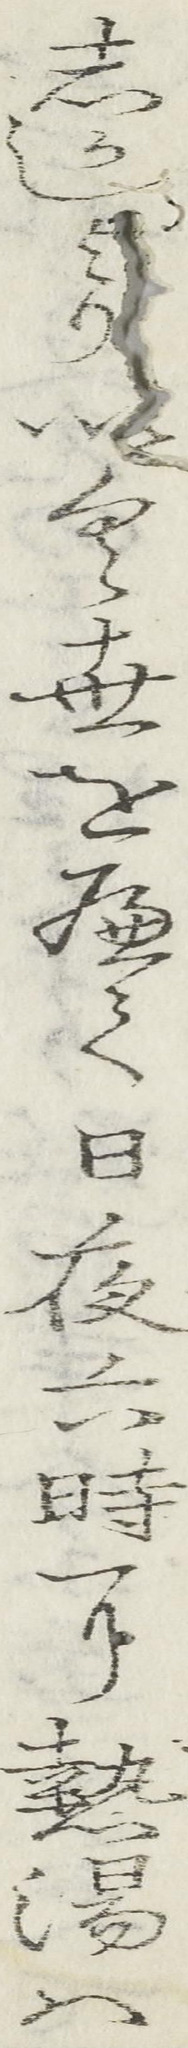しかしよりいく世をへて日夜六時に熱湯は
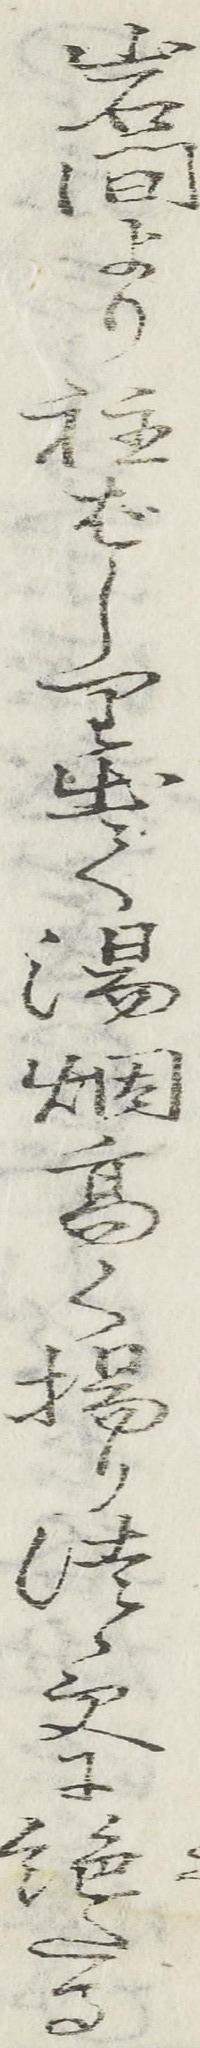岩間より程ばしり出て湯烟高く揚りつゝ更に絶たる
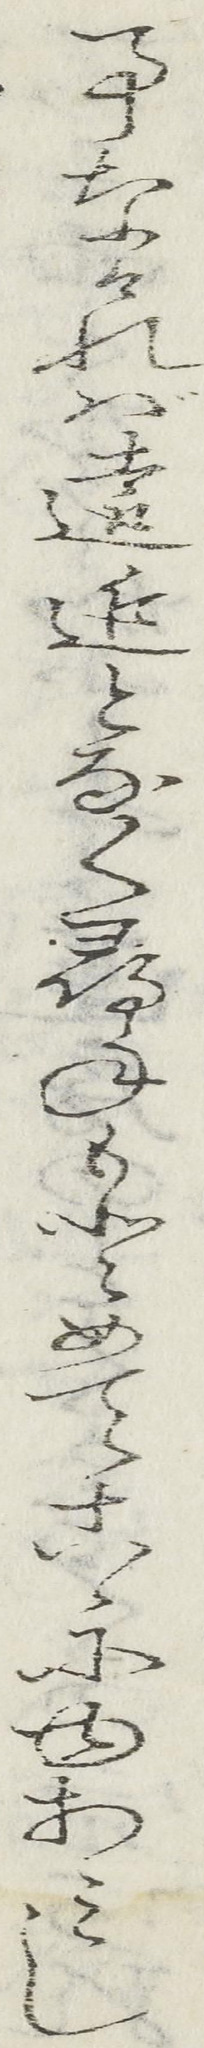事なければ遠近となく尋ねもとめてこゝにゆあみし
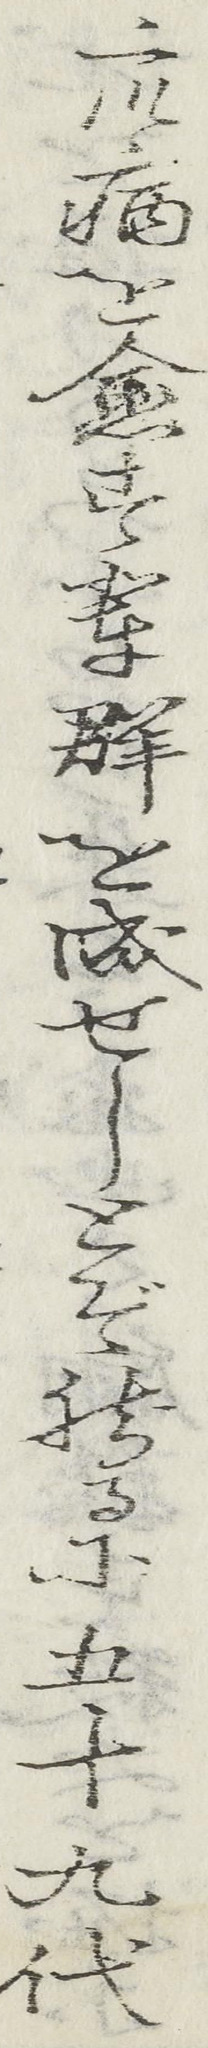衆病を愈す輩群を成せしとぞ然るに五十九代
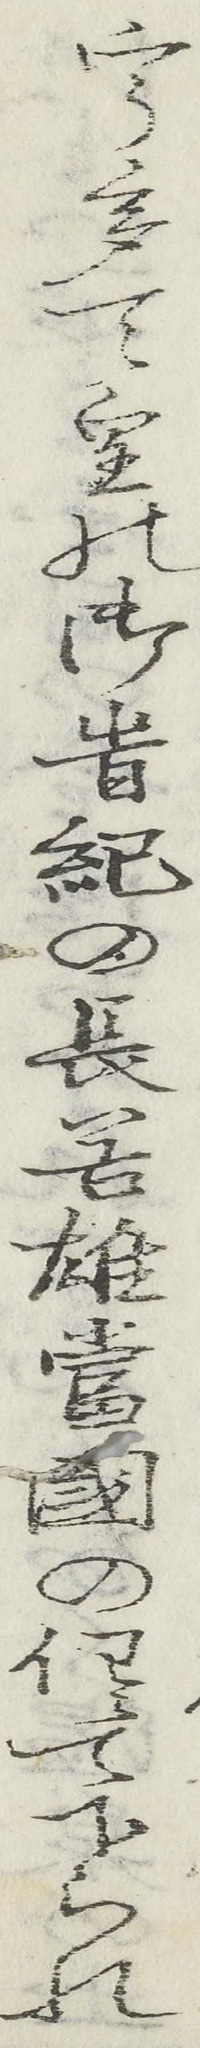宇多天皇の御時紀の長谷雄当国の任にて下られ
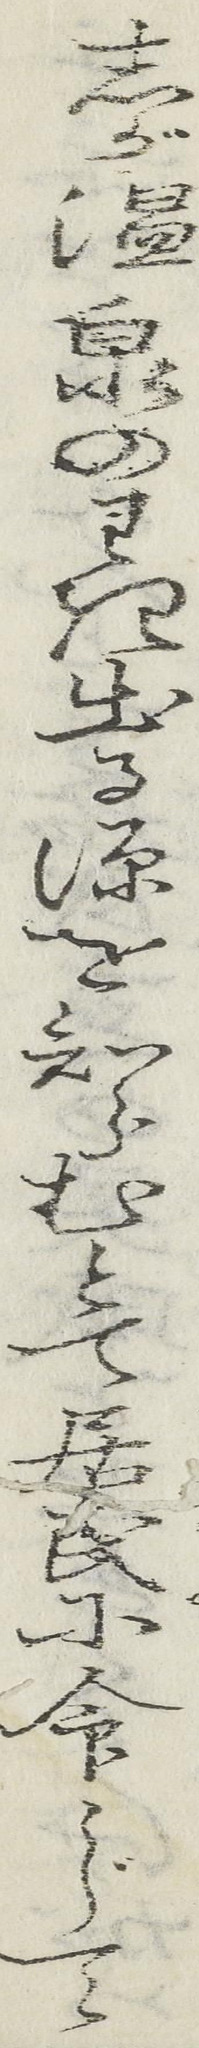しが温泉のわき出る源を知らむとて居民に命じて

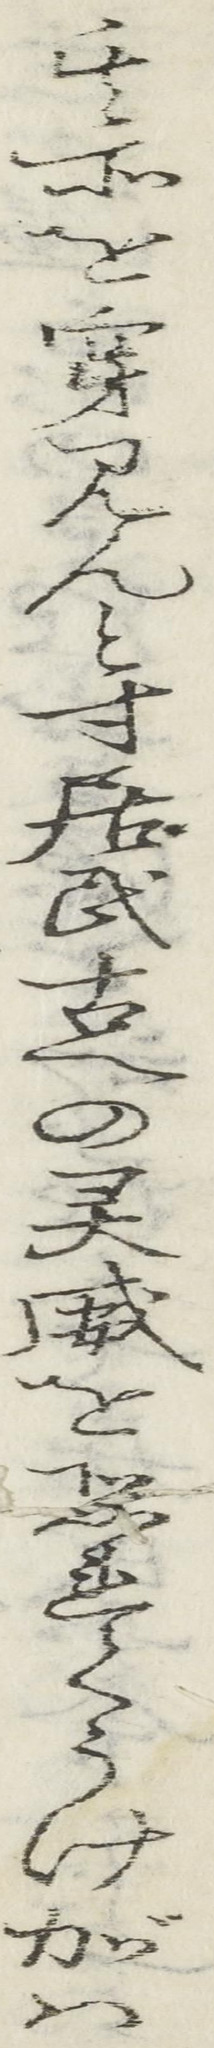其所を穿見んとす居民古への霊威を恐れてうけがは
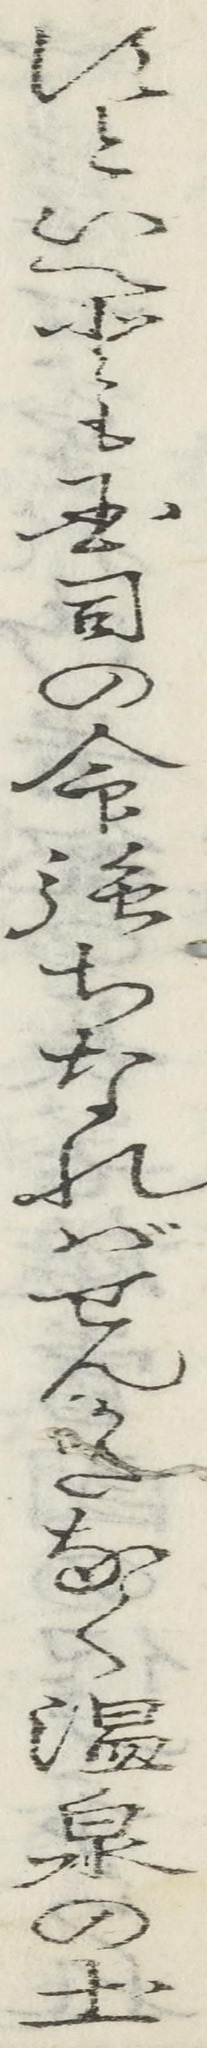すといへども国司の命強ちなればせんかたなく温泉の土
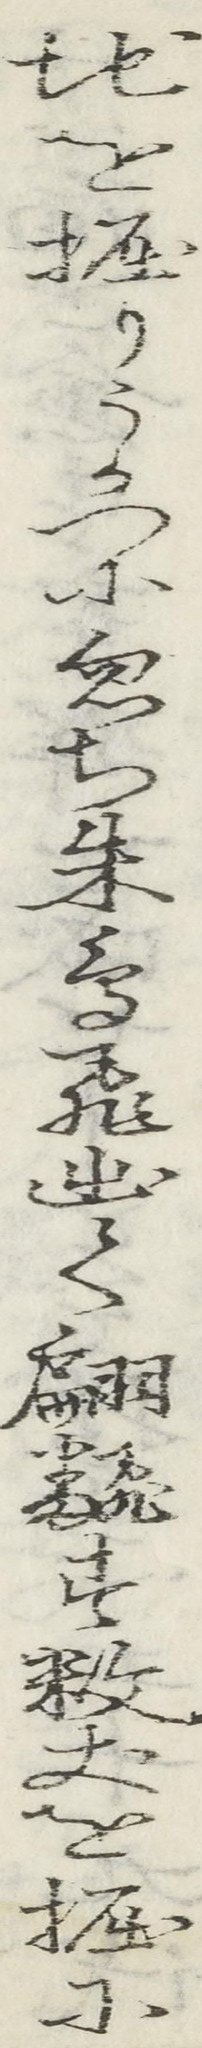地を掘りうかつに忽ち朱鳥飛出て翩翻す数丈を掘に
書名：豆州熱海温泉由来記
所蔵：東京大学地震研究所図書室 Earthquake Research Institute Library, The University of Tokyo, JAPAN
